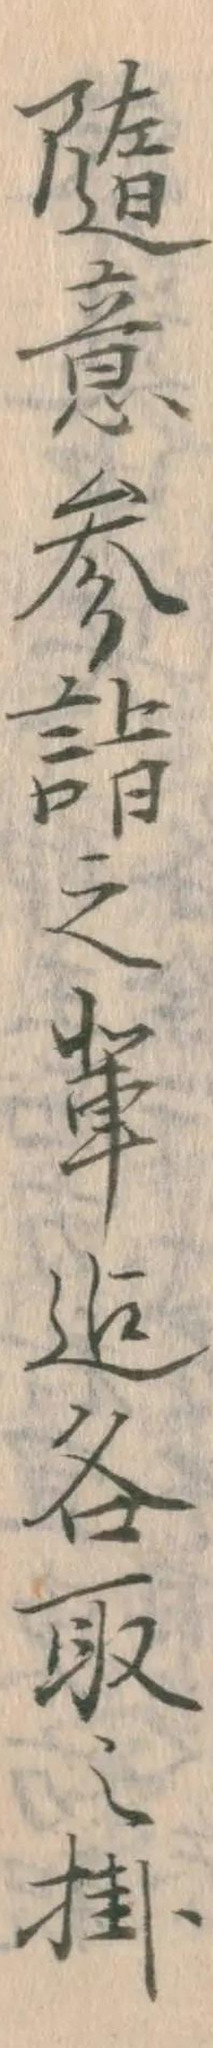随意参詣之輩迄各取之掛
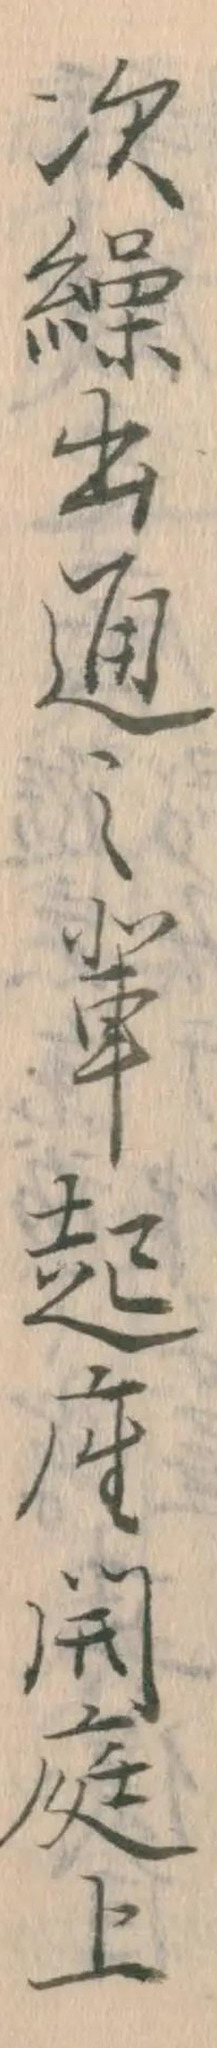次繰出通之輩起座開庭上
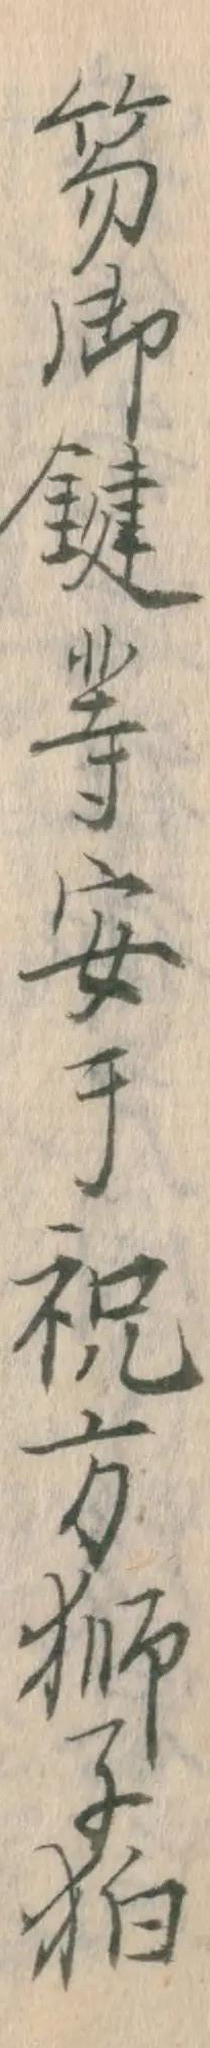笏御鍵等安于祝方獅子狛
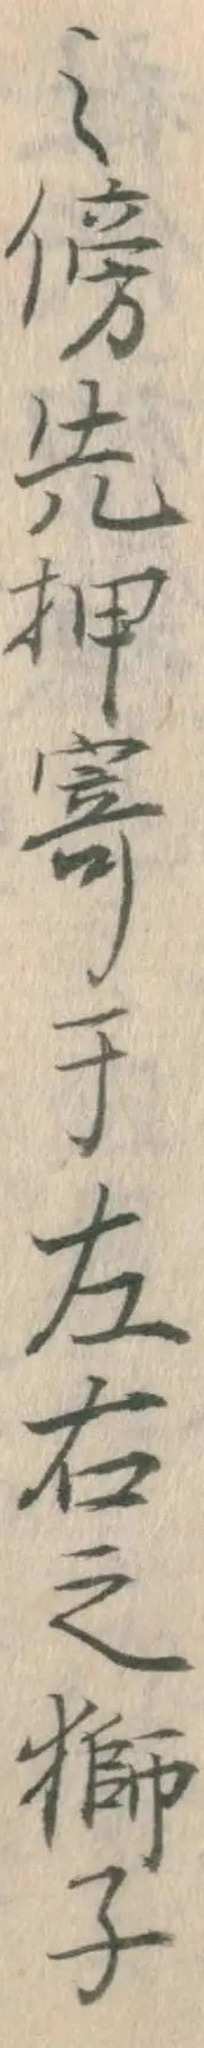之傍先押寄于左右之獅子
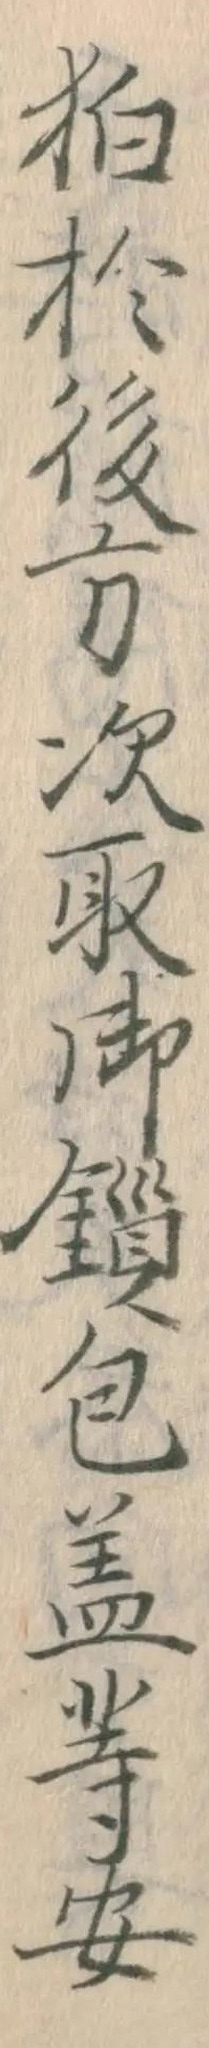狛於後方次取御鎖包蓋等安
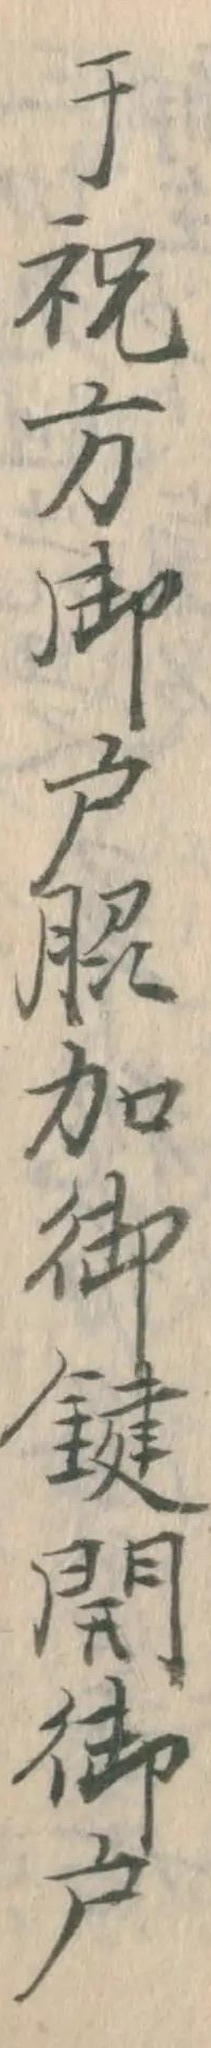于祝方御戸脇加御鍵開御戸

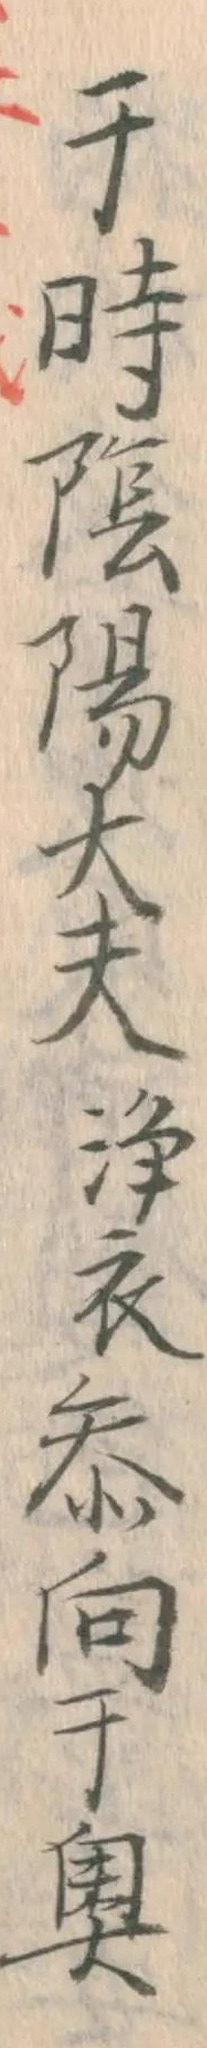于時陰陽大夫浄衣参向于奥
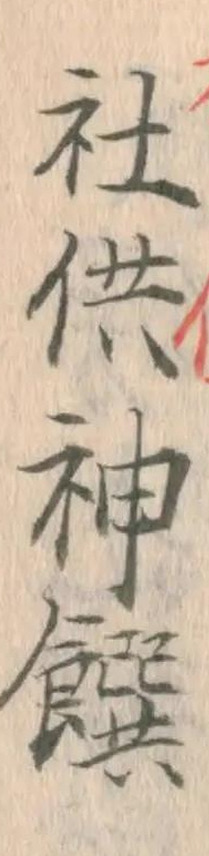社供神饌
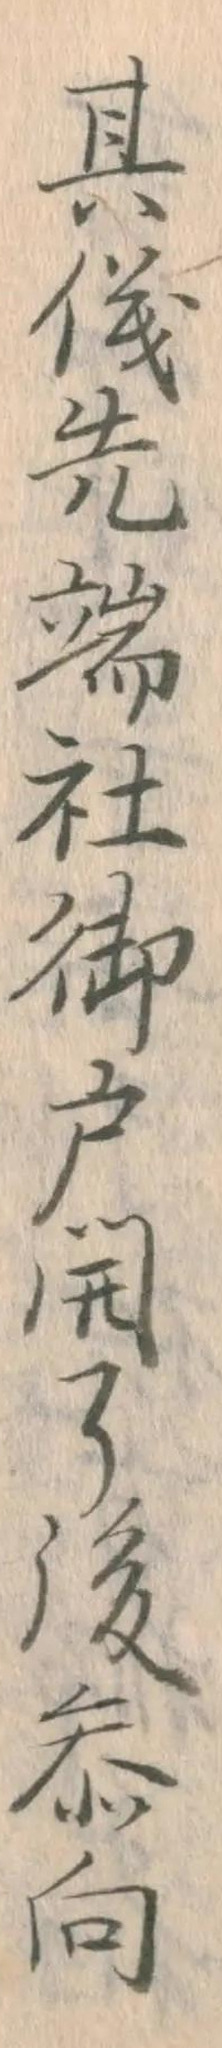其儀先端社御戸開了後参向
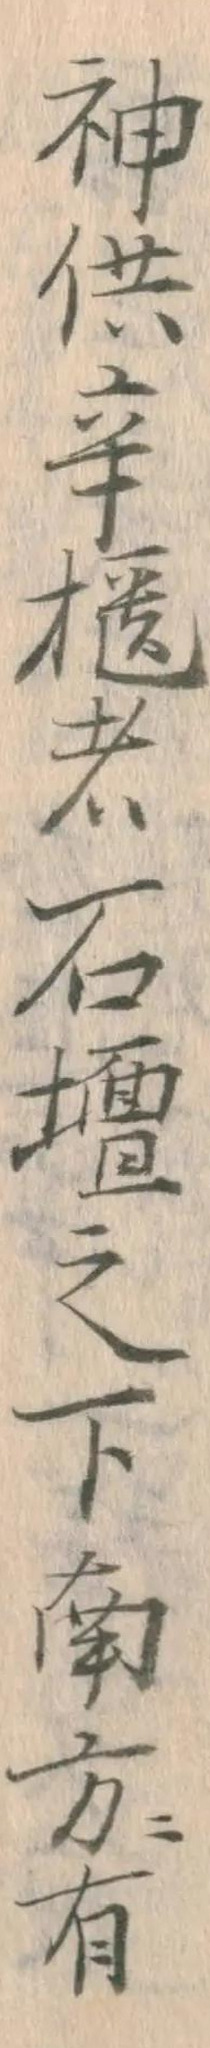神供辛櫃者石壇之下南方に有
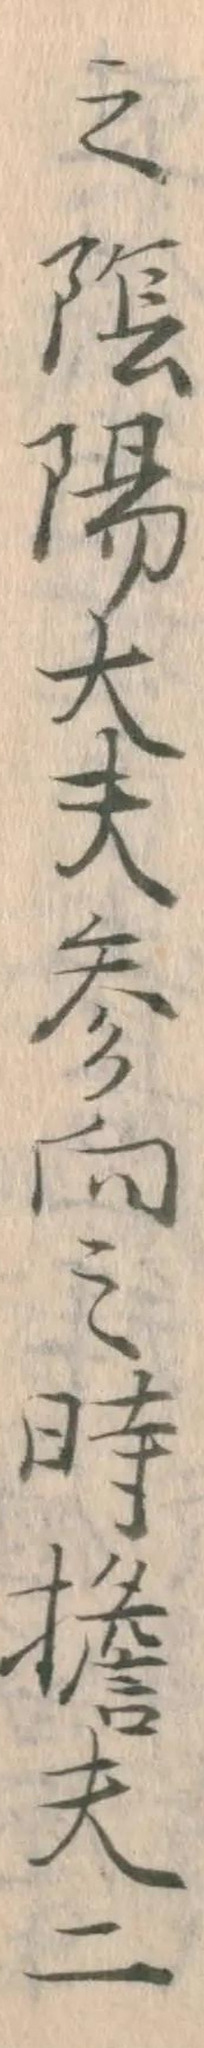之陰陽大夫参向之時担夫二
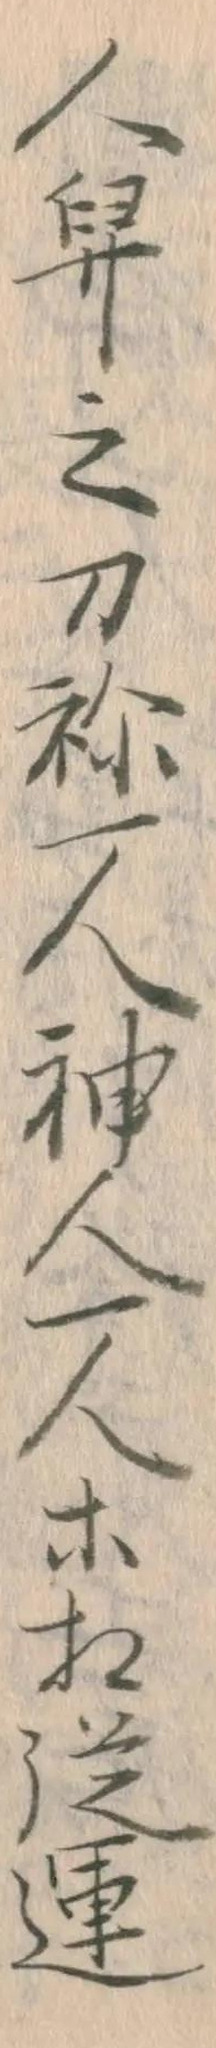人舁之刀祢一人神人一人等相従運
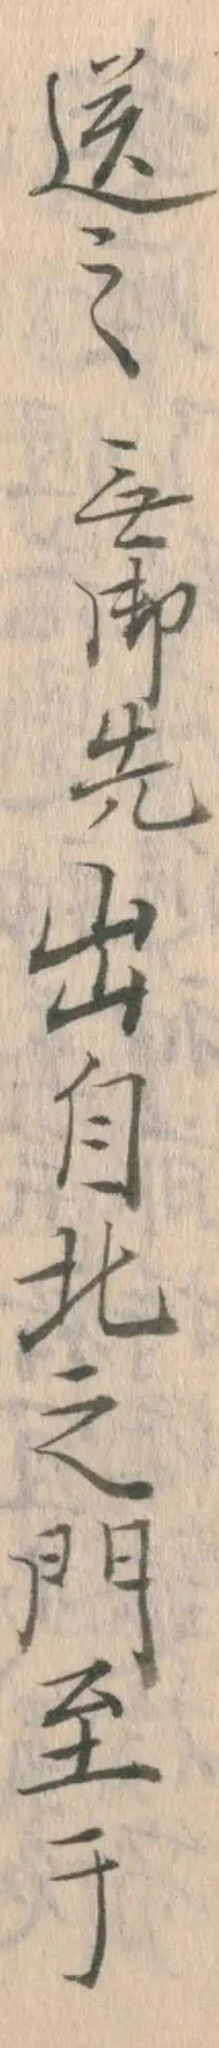送之無御先出自北之門至于
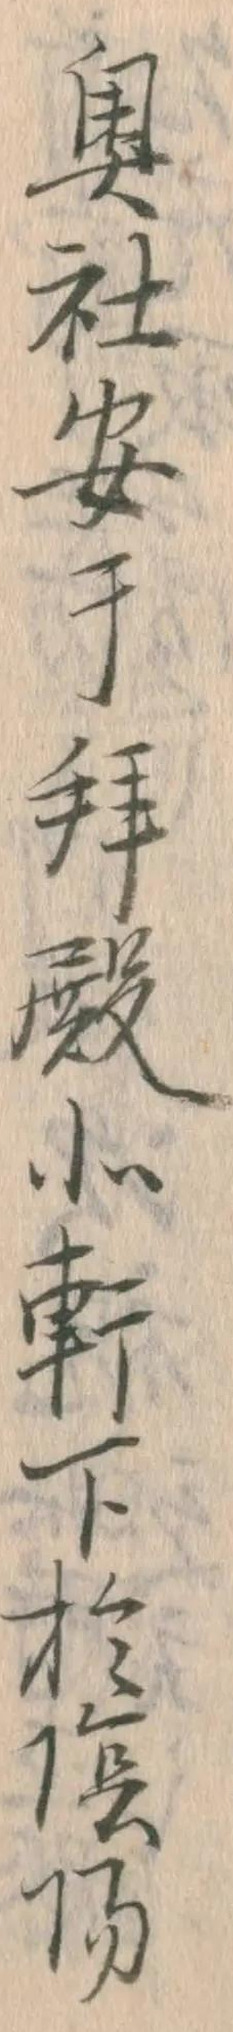奥社安于拜殿北軒下於陰陽
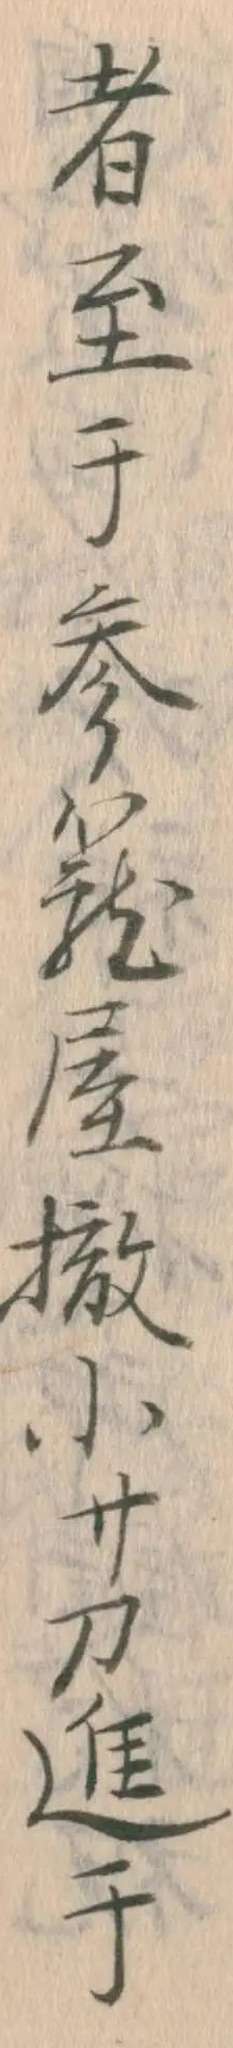者至于参籠屋撒小さ刀進于
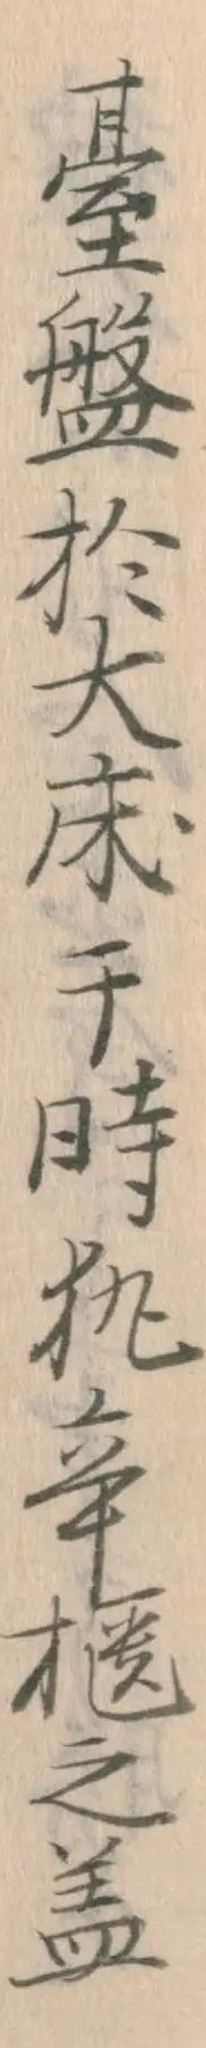台盤於大床于時執辛櫃之蓋
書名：賀茂社記録. 第81冊
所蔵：国立国会図書館 National Diet Library, JAPAN
